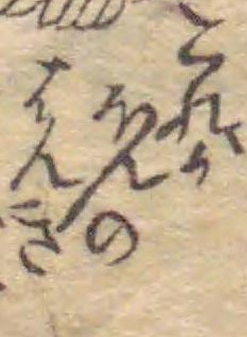はんき

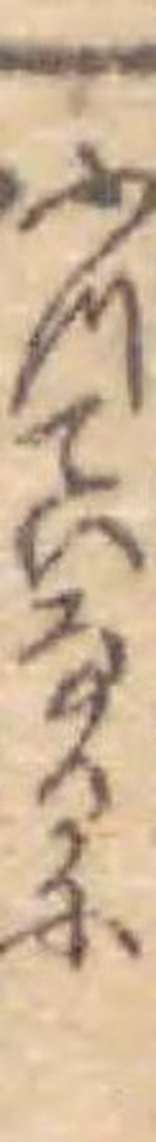ふつていなるに
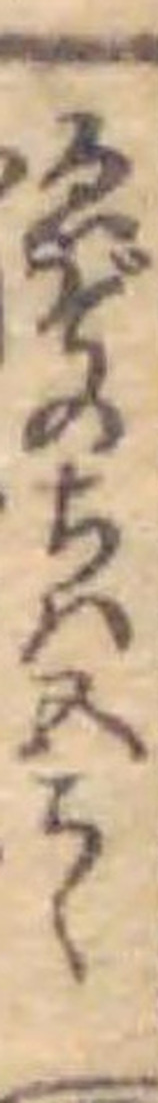ゑぞのちは五こく
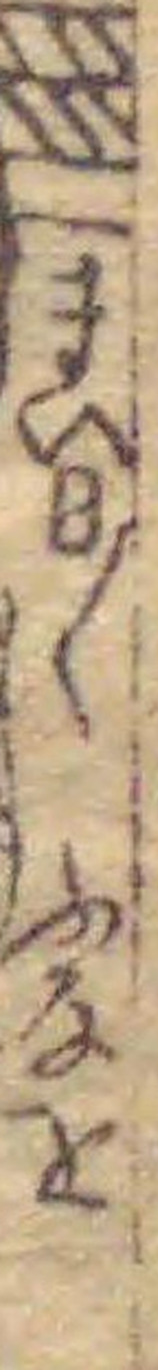まい日〳〵ふなを
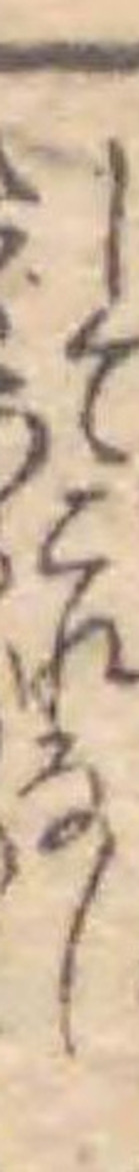してこれなし
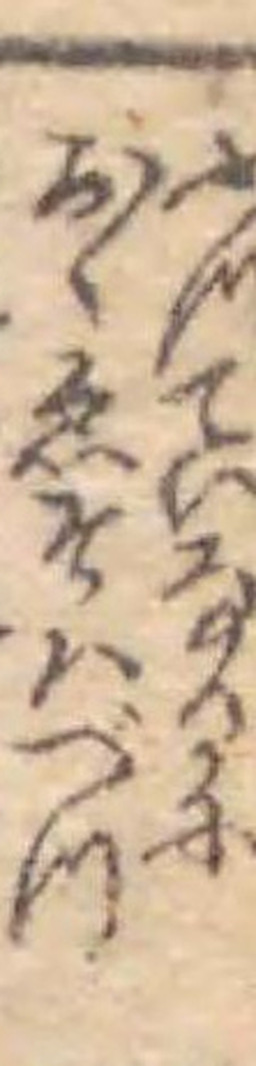おくゑそはべつ
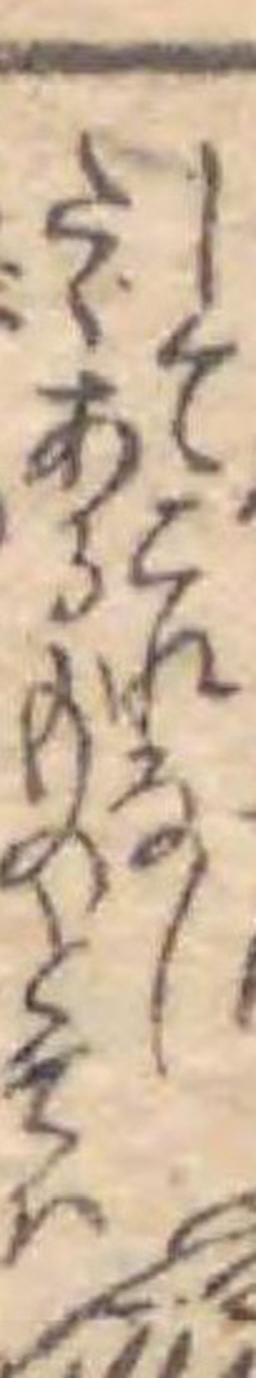たゞあるものとては
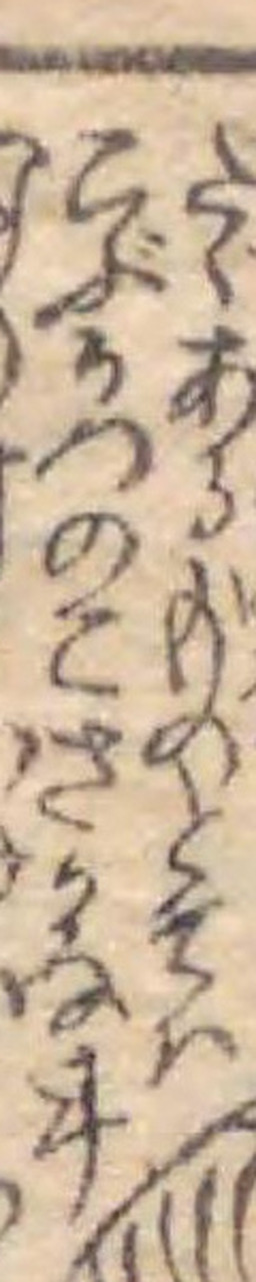こぶかつのこさかな斗
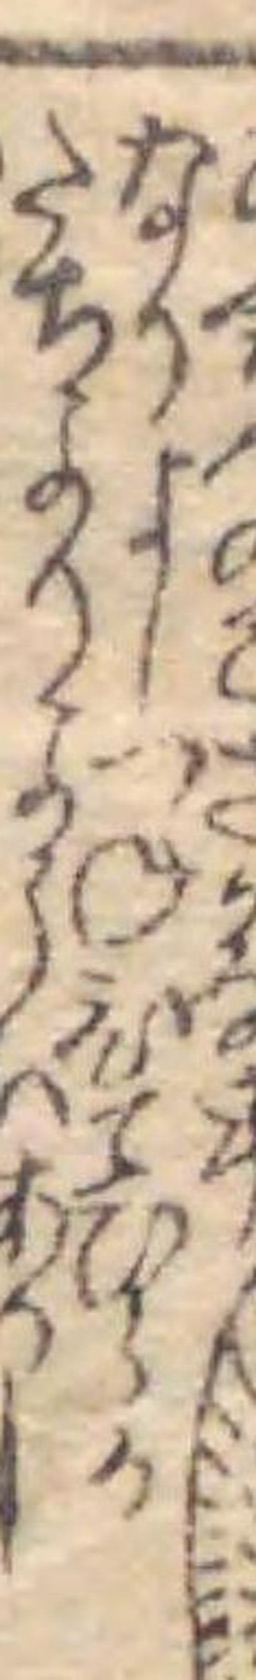たちよりよういありし
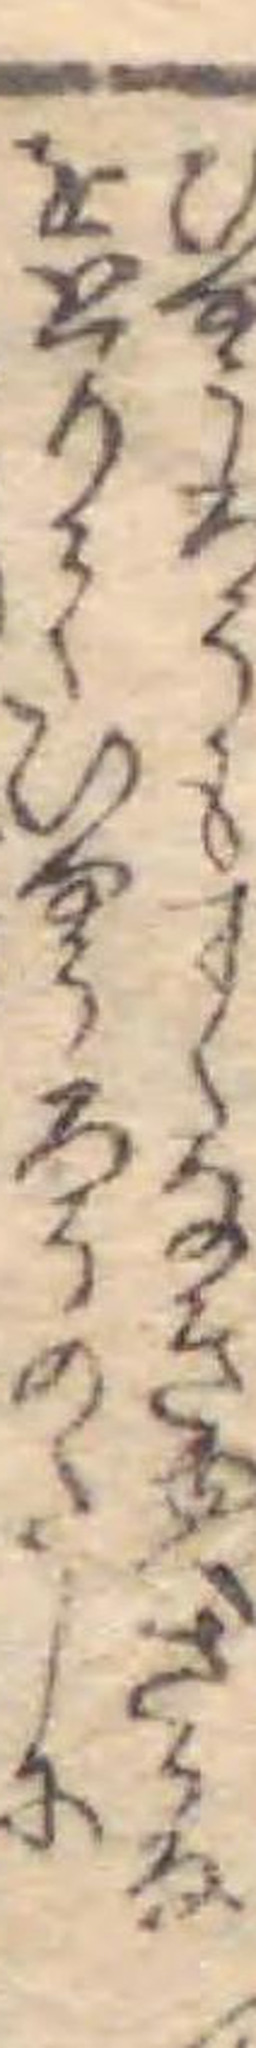をとりてひやうろうのたしに
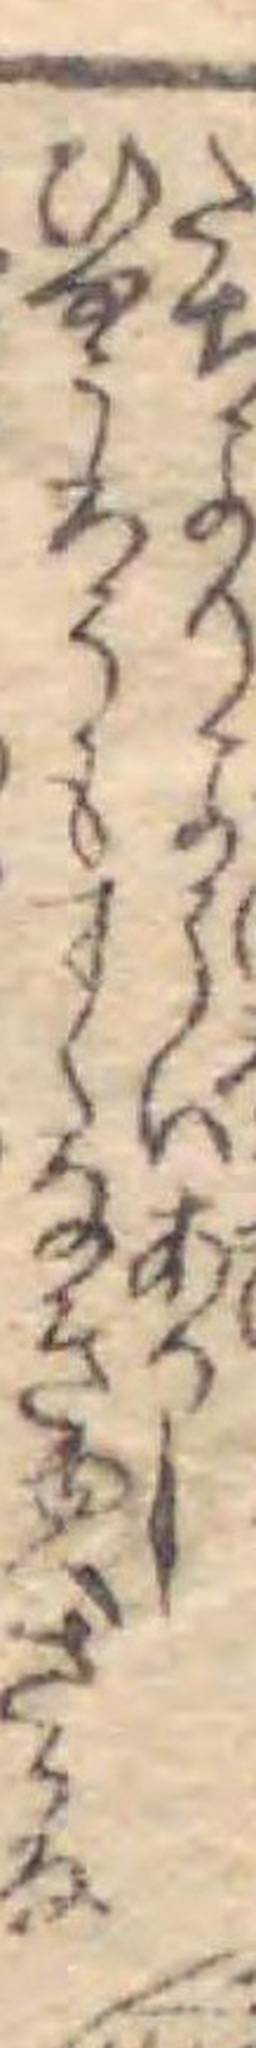ひやうろうもすくなきゆへさかな
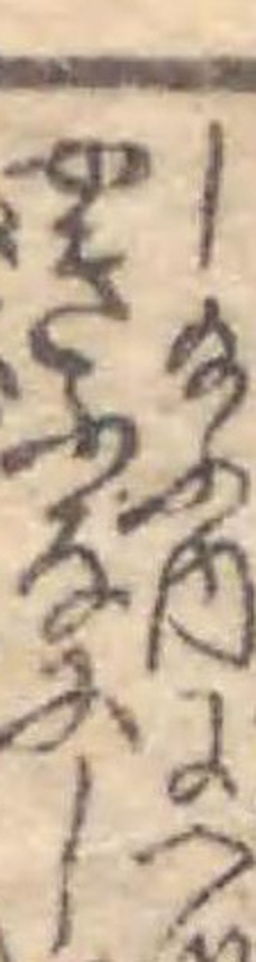やきふなは
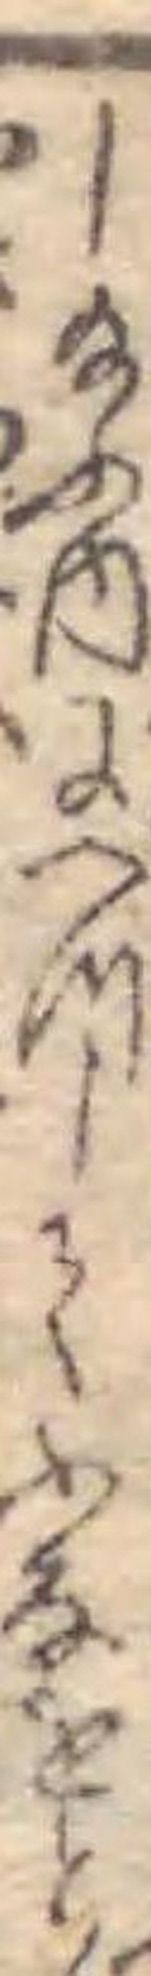し給ふ内にへつしてふなをとり
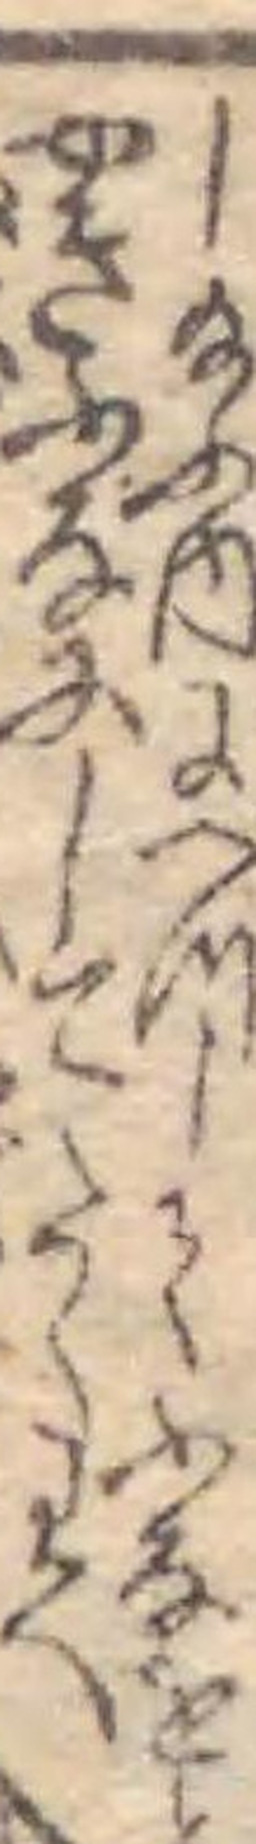やきふなにしてたくわへ
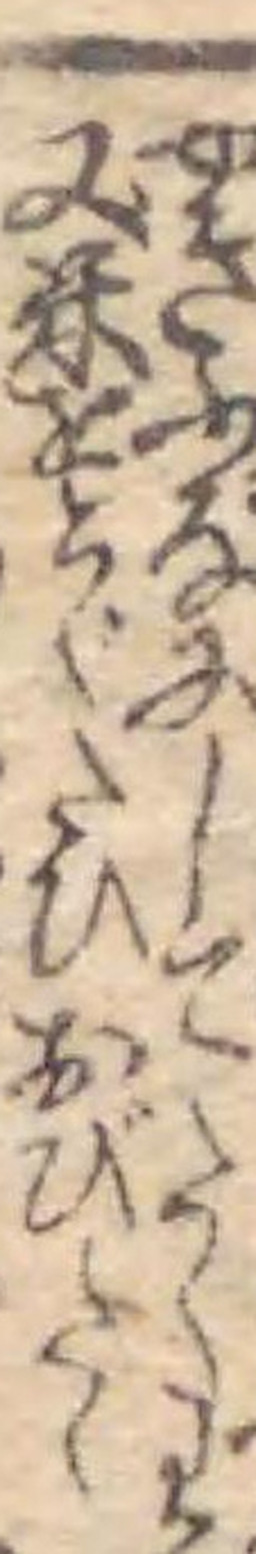又米をとぐたひおびたゝ
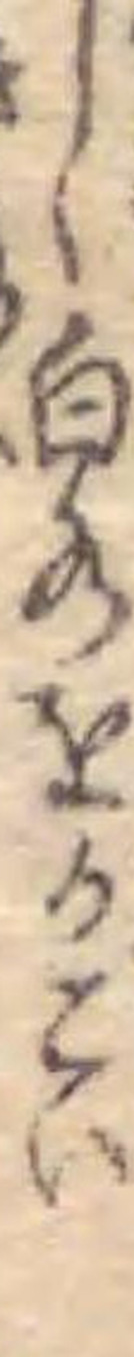しく白水をかこい
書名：悦贔負蝦夷押領 : 3巻
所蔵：国立国会図書館 National Diet Library, JAPAN
